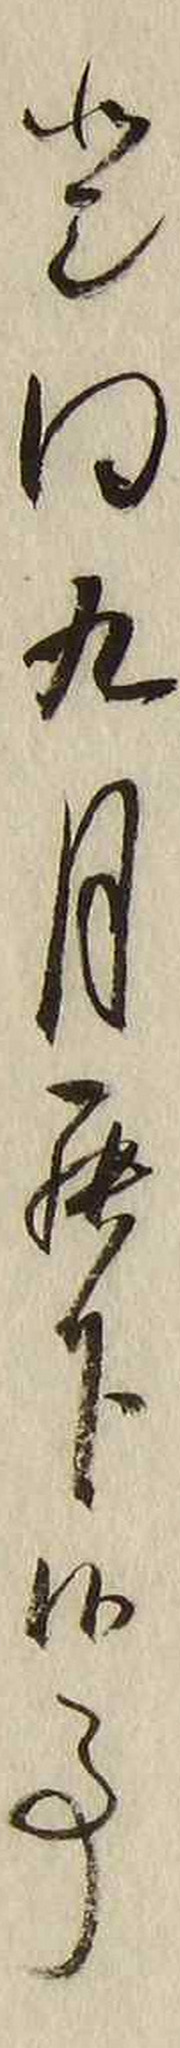登同九月罷下候事

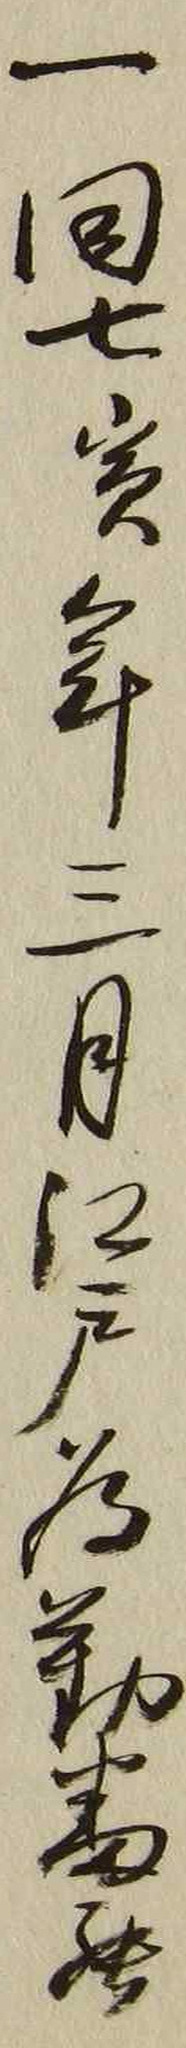一同七寅年三月江戸為勤番罷
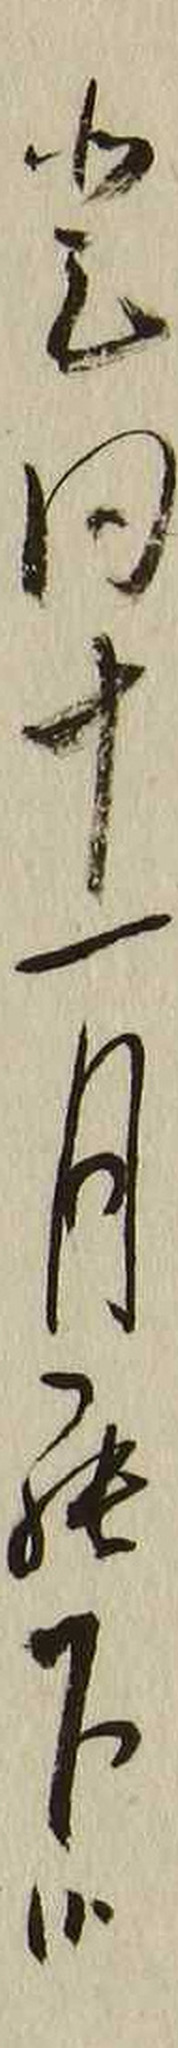登同十一月罷下候
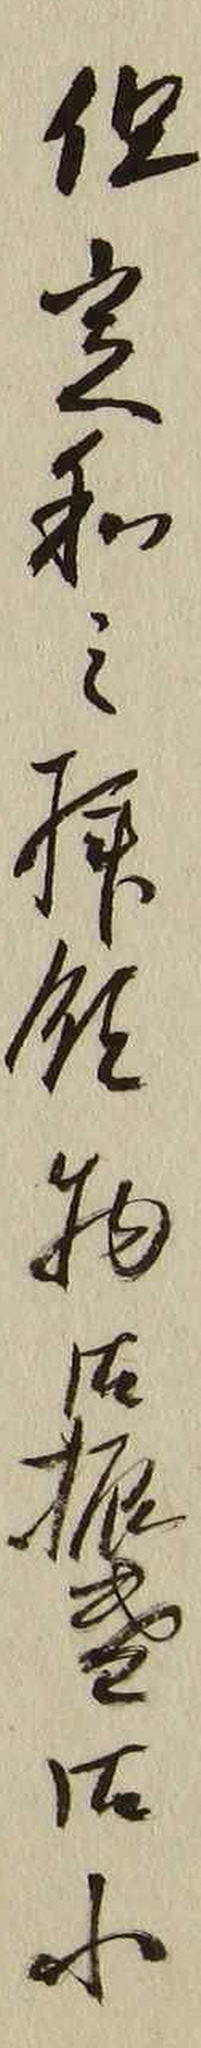但定和之拝領物御振替御小
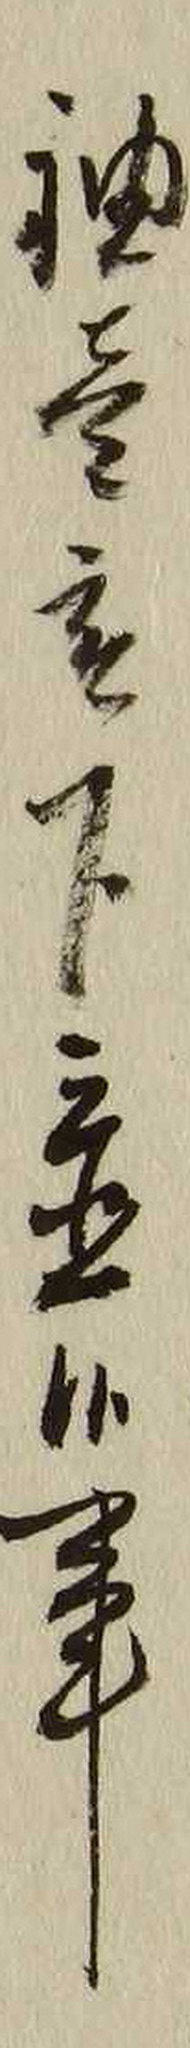袖壱被下置候事
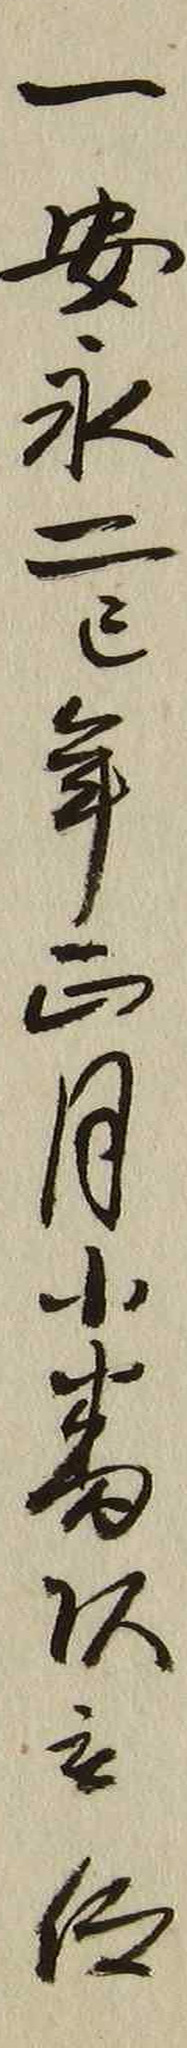一安永二巳年正月小番頭被仰
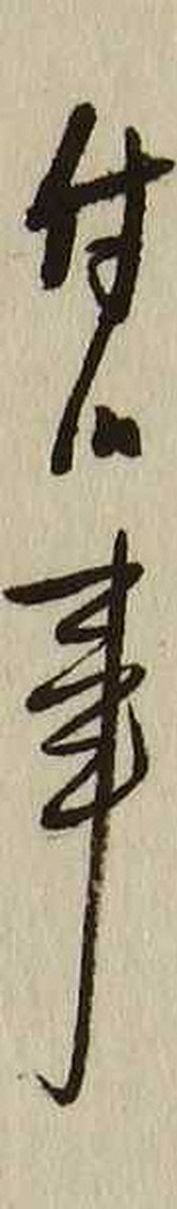付候事
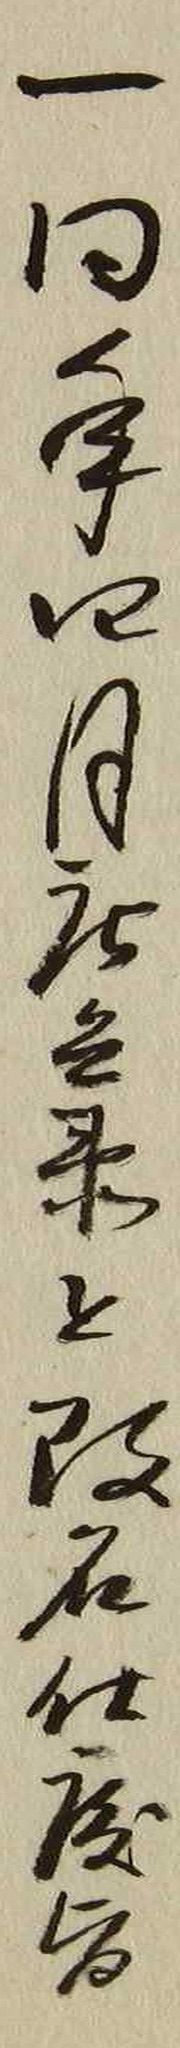一同年四月庄兵衛と改名仕度旨
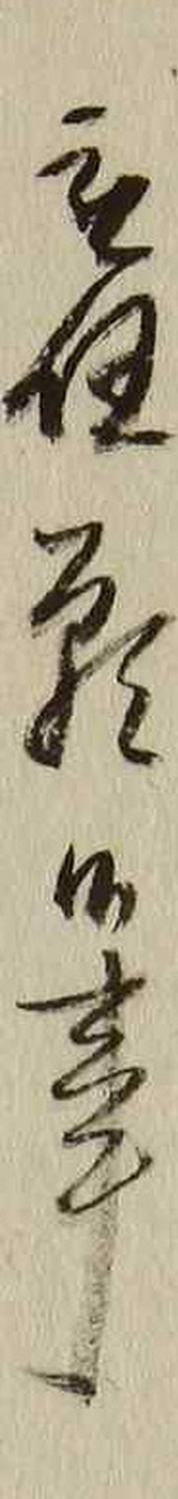被任願候事
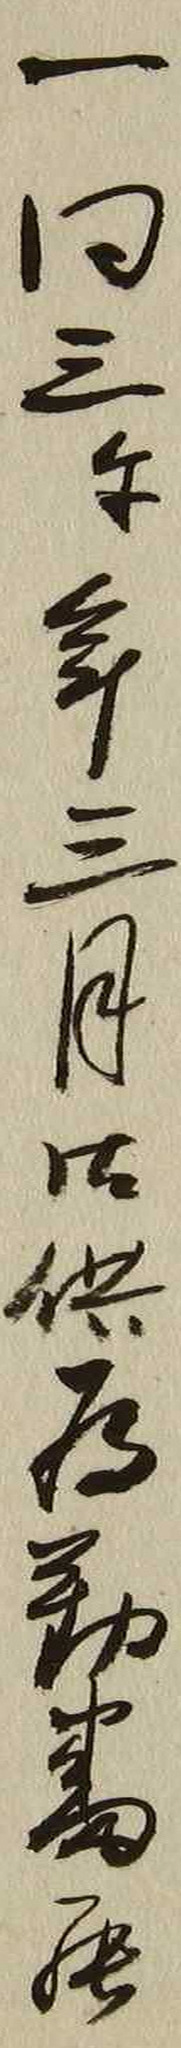一同三午年三月御供為勤番罷
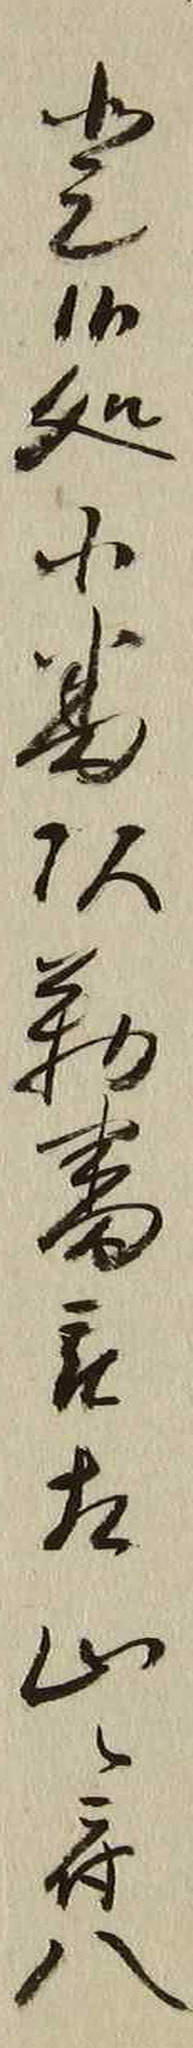登候処小番頭勤番被相止候ニ付八
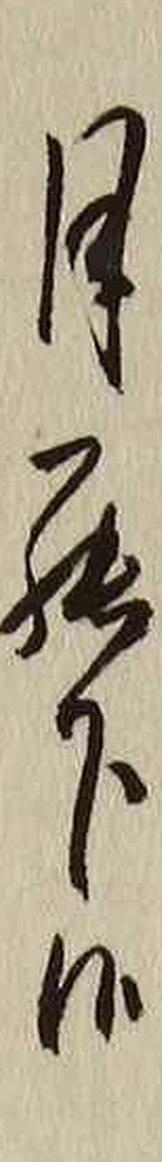月罷下候
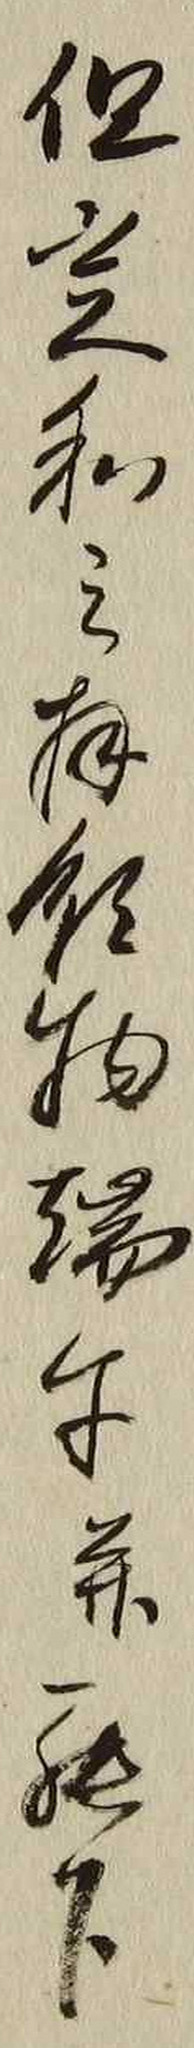但定和之拝領物端午并罷下
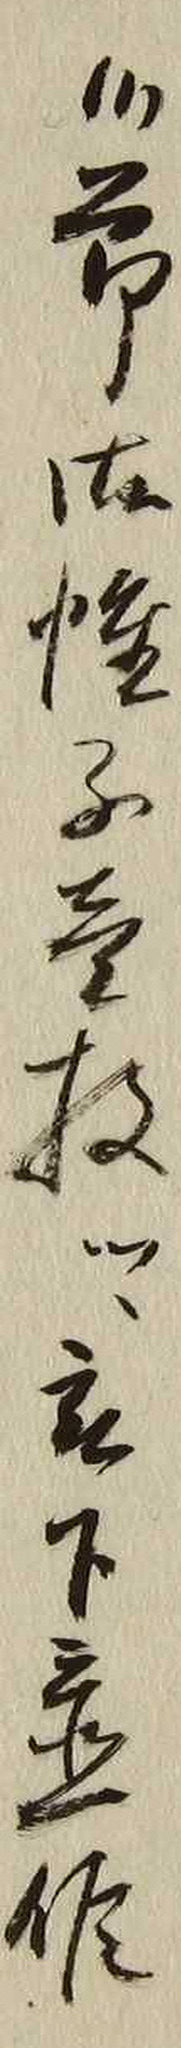候節御帷子壱枚ツヽ被下置候
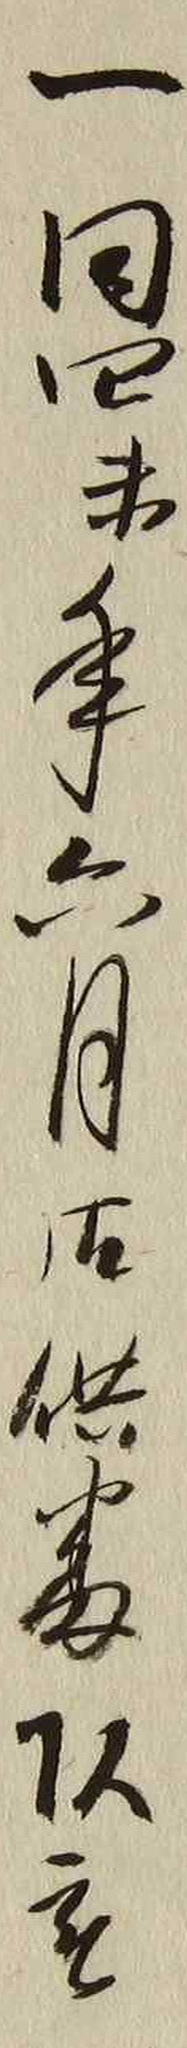一同四未年六月御供番頭被
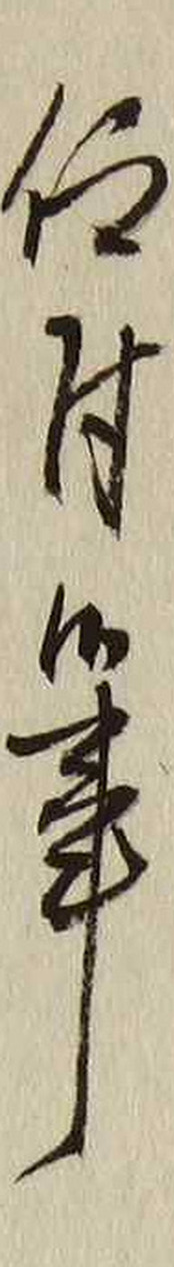仰付候事
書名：諸士系譜　巻之356　す之部6
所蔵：会津若松市立会津図書館
